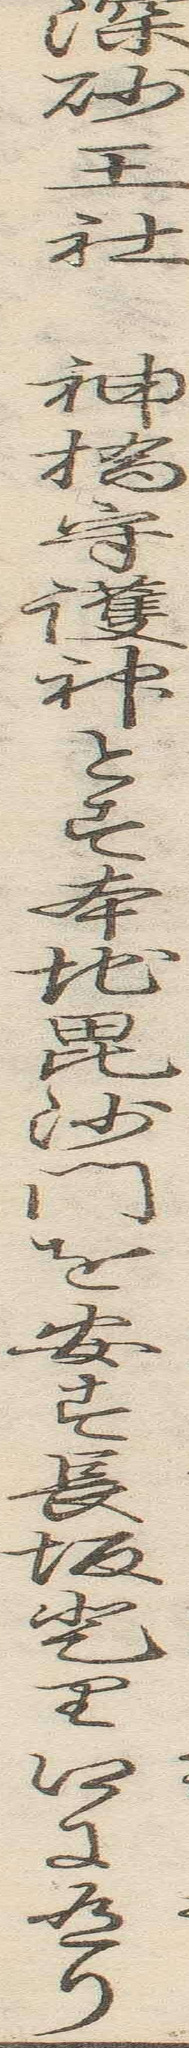深砂王社神橋守護神とす本地毘沙門を安す長坂登り口に有り
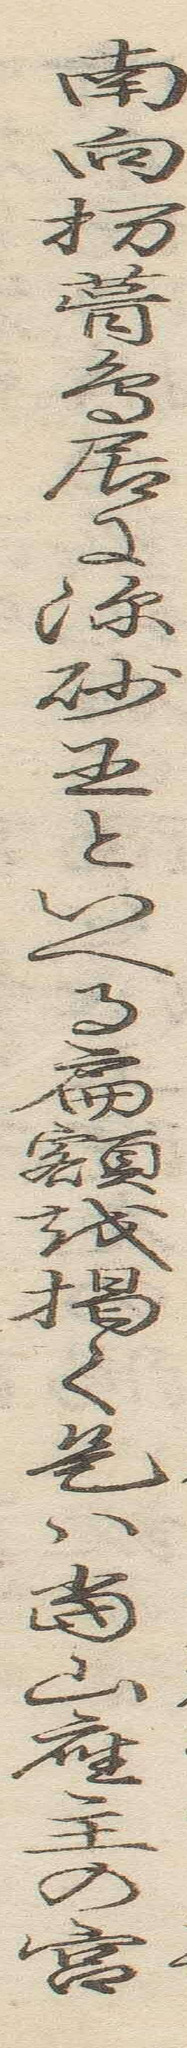南向栃葺鳥居に深砂王といへる扁額を掲く是は當山座主の宮
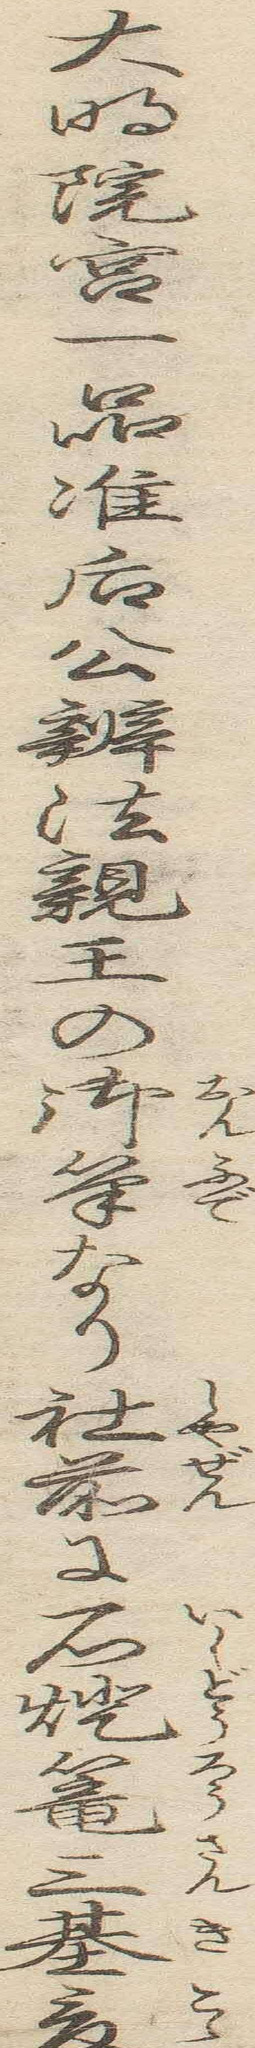大明院宮一品准后公辨法親王の御筆なり社前に石燈篭三基爰
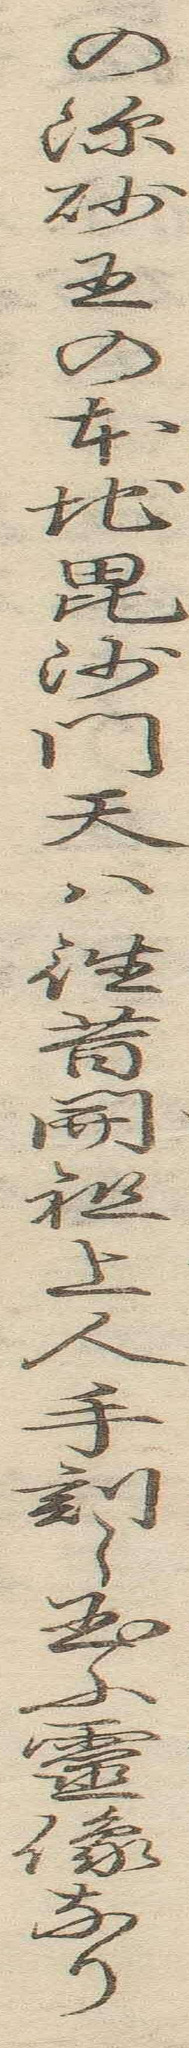の深砂王の本地毘沙門天は徃昔開祖上人手刻し玉ふ靈像なり

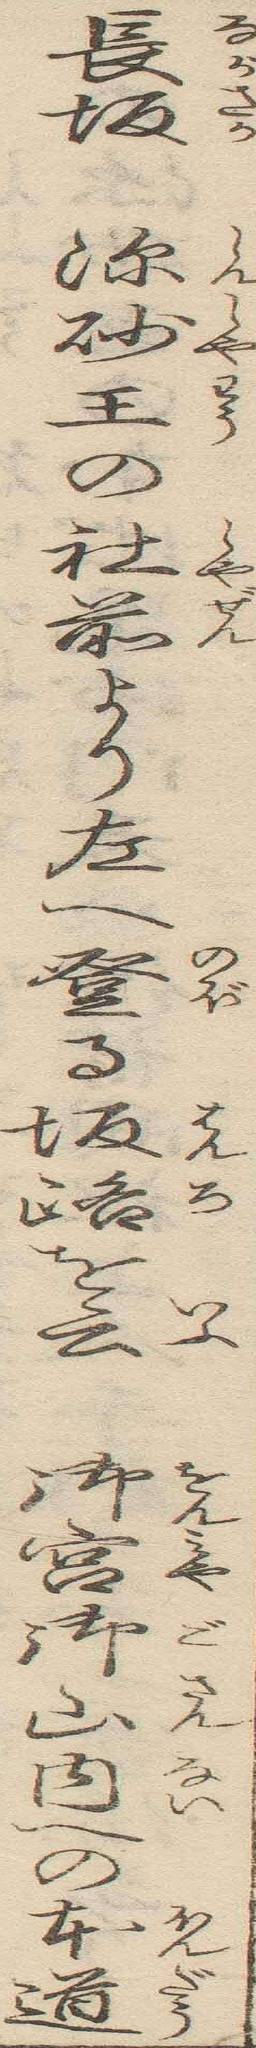長坂深砂王の社前より左へ登る坂路を云御宮御山内への本道
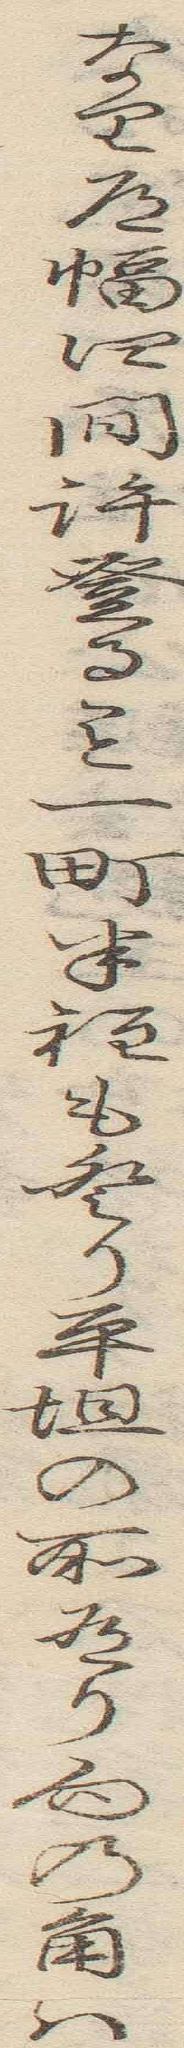なり道幅四間許登ること一町半程も登り平坦の所有り向の角は
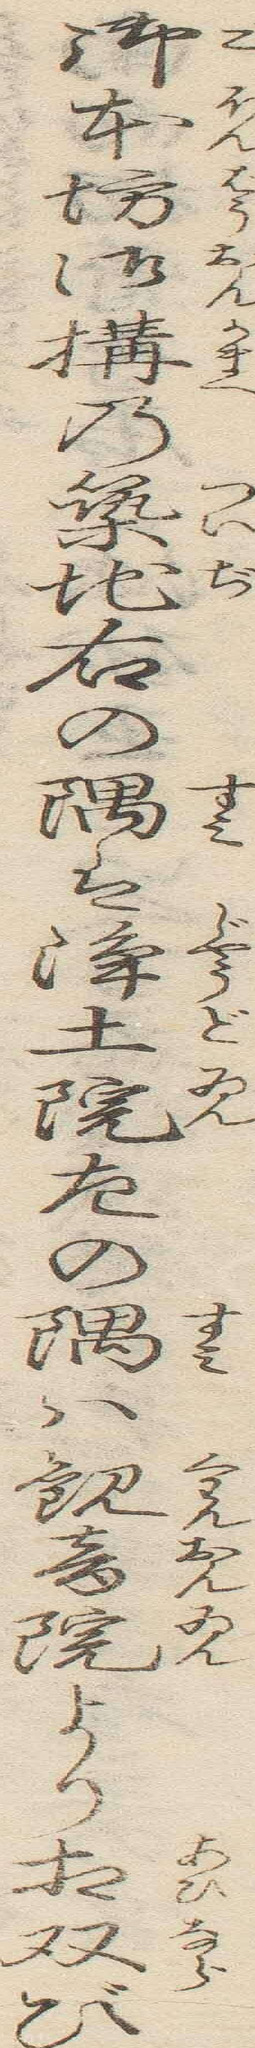御本坊御構の築地右の隅は浄土院左の隅は観音院より相双び
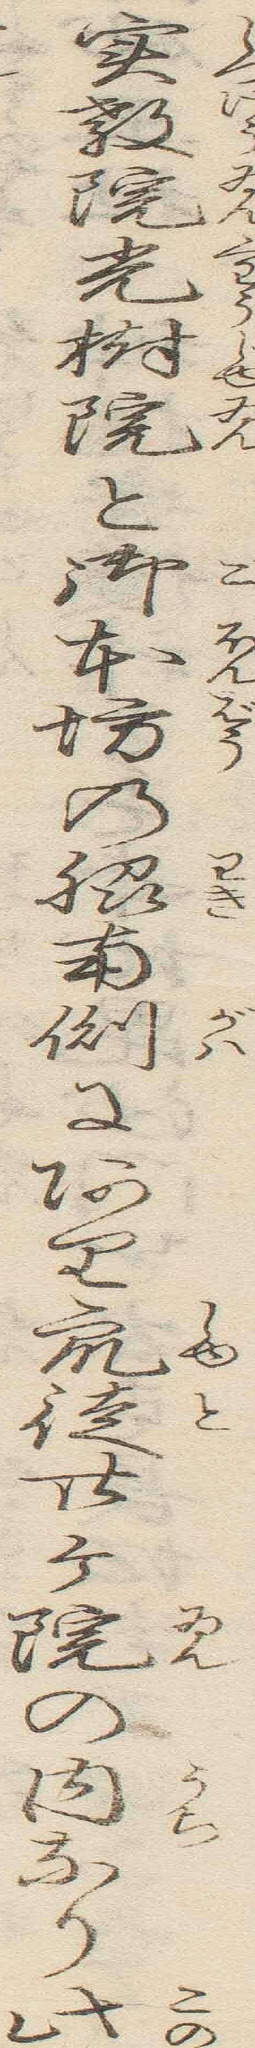実敎院光樹院と御本坊の脇南側にあり衆徒廿ヶ院の内なり此
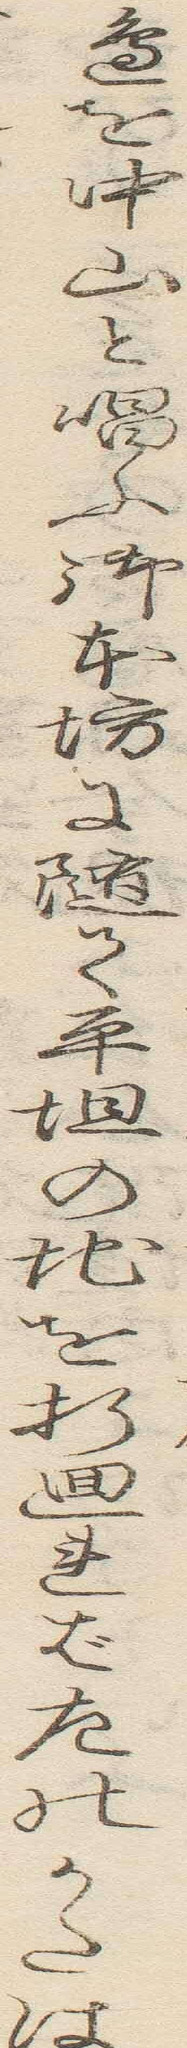邊を中山と唱ふ御本坊に随て平坦の地を打廽れば左のかたは
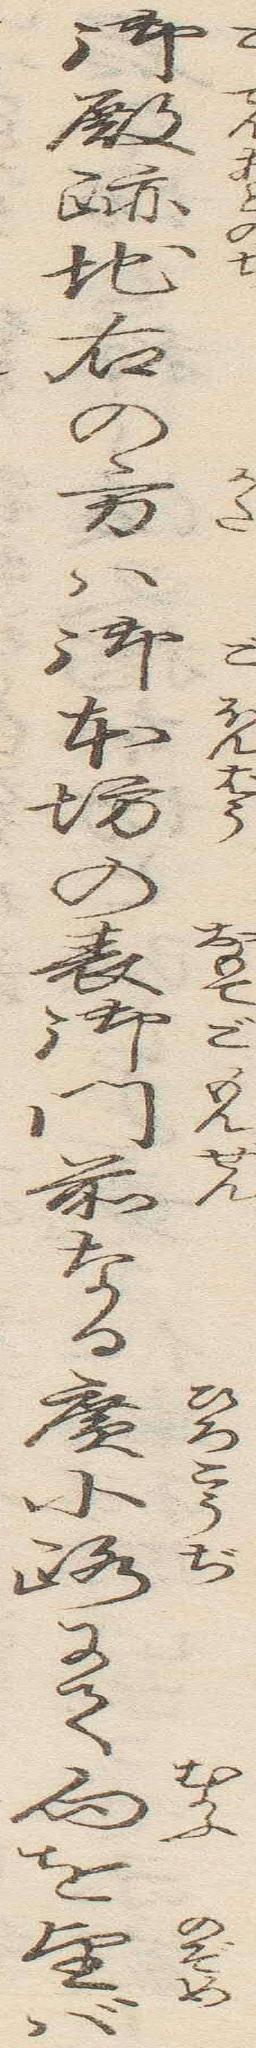御殿跡地右の方は御本坊の表御門前なる廣小路にて向を望ば
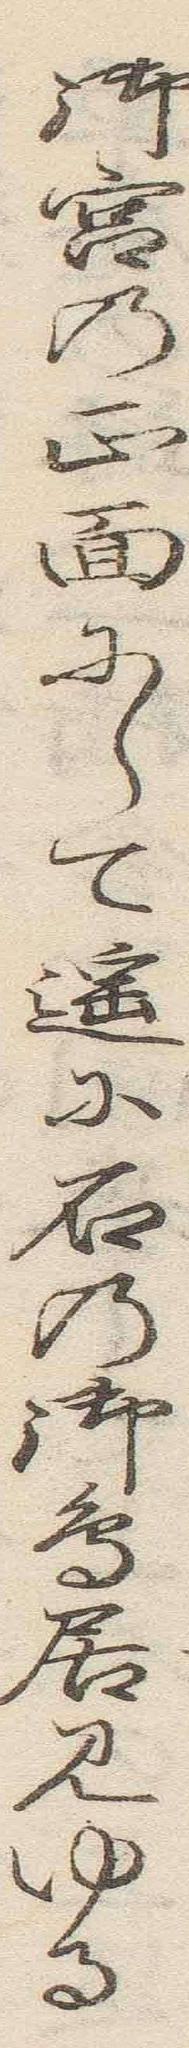御宮の正面にして遥に石の御鳥居見ゆる
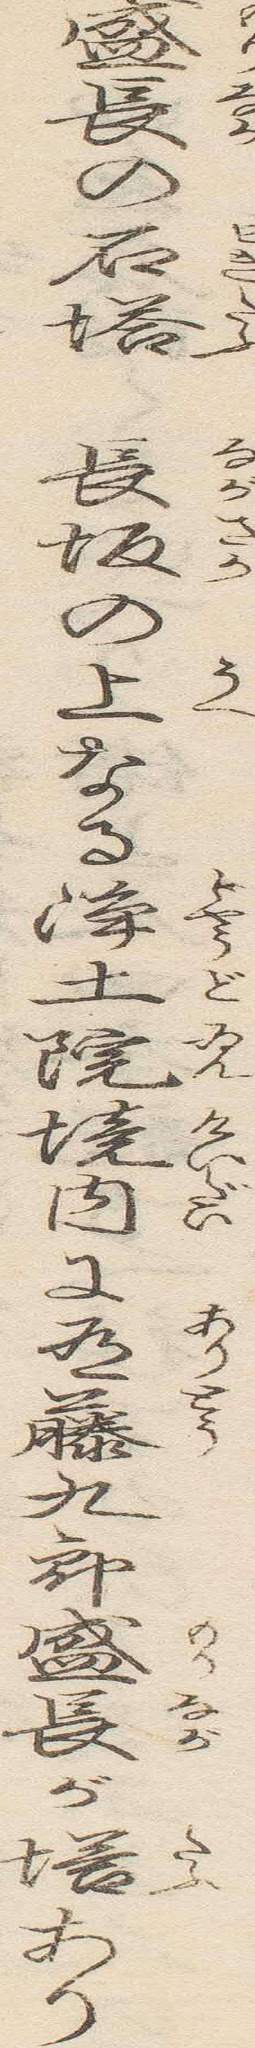盛長の石塔長坂の上なる浄土院境内に有藤九郎盛長が塔あり
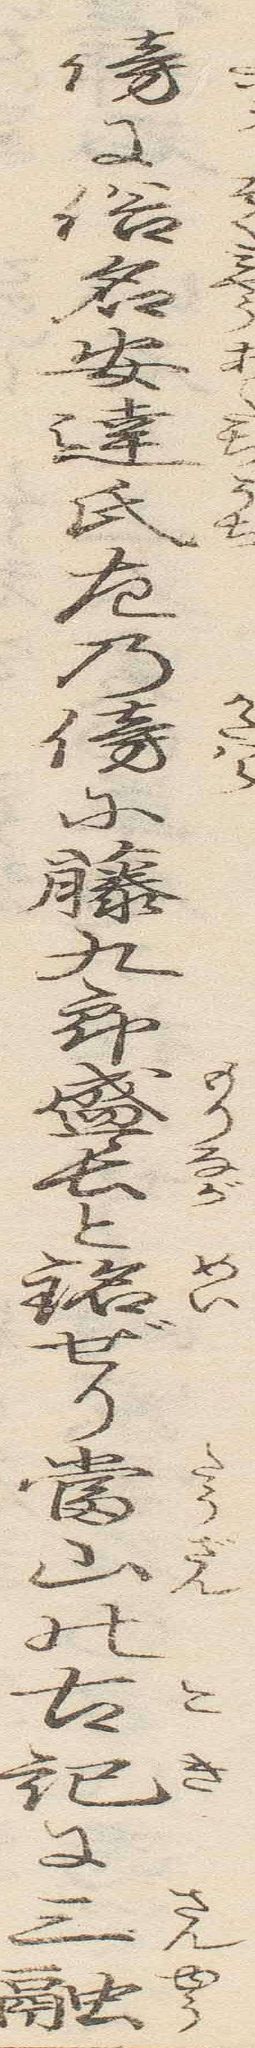傍に俗名安達氏左の傍に藤九郎盛長と銘ぜり當山の古記に三融
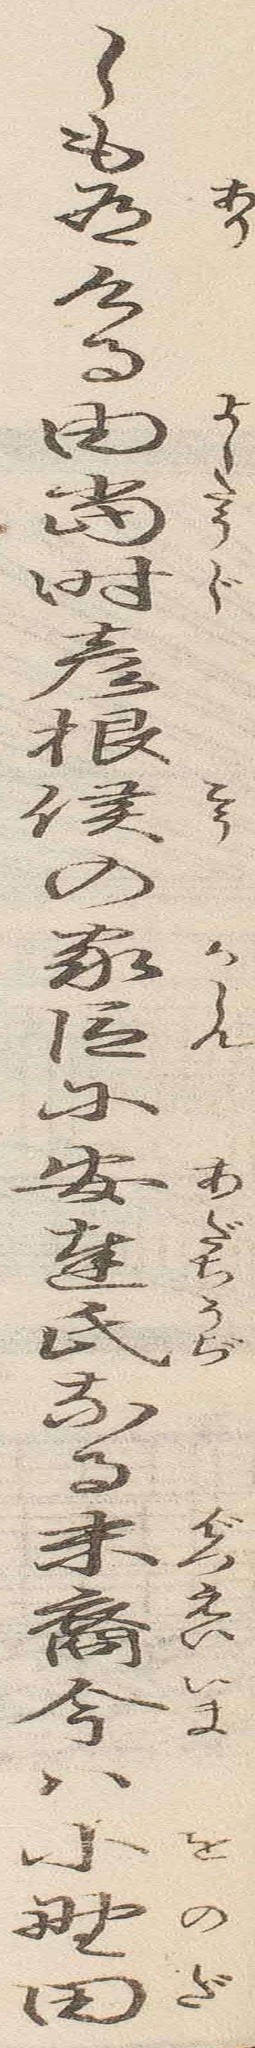しも有ける由當时彦根侯の家臣に安達氏なる末裔今は小㙒田
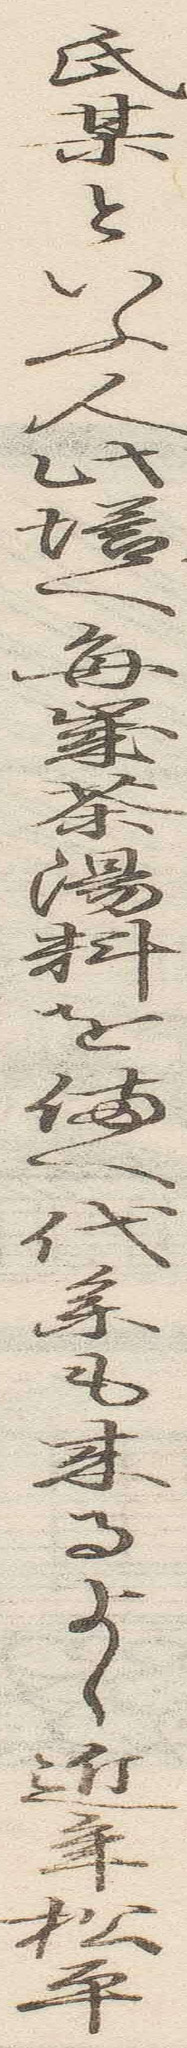氏某といふ人此塔へ每歳茶湯料を備へ代参も来るよし近年松平
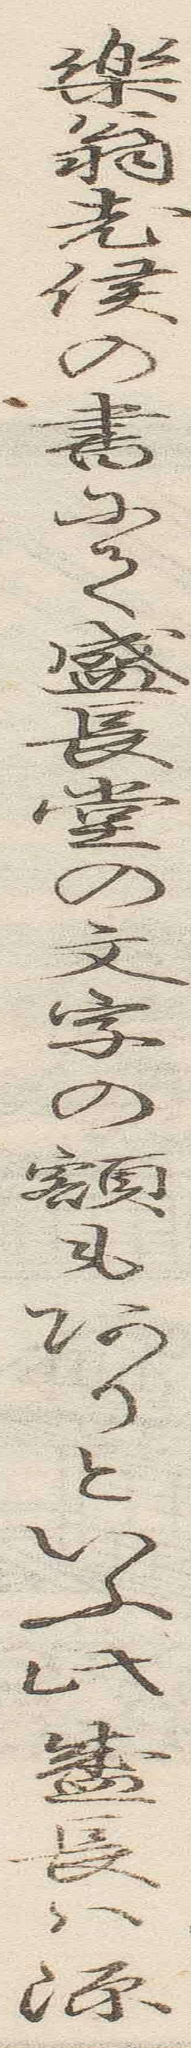樂翁老侯の書にて盛長堂の文字の額もありといふ此盛長は源
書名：日光山志
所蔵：東京学芸大学附属図書館 国文学研究資料館
